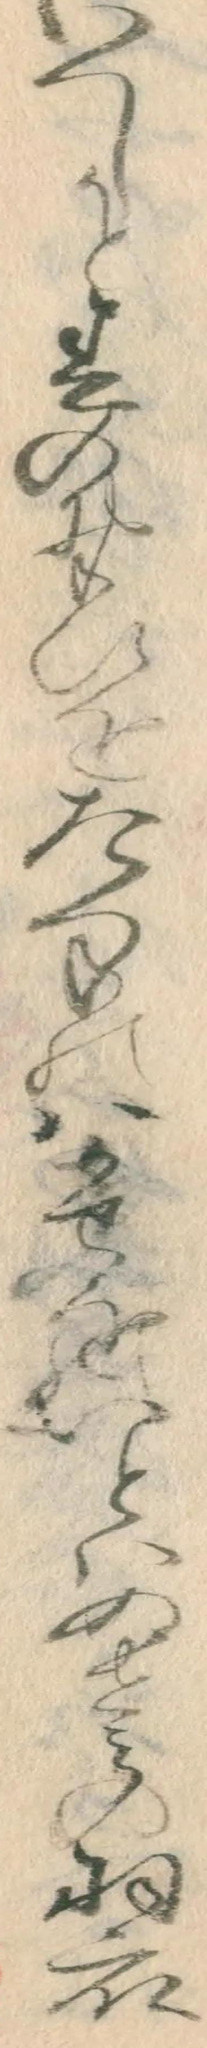いつしかと春のおもひをたつものはかせをいとはぬせみの羽衣

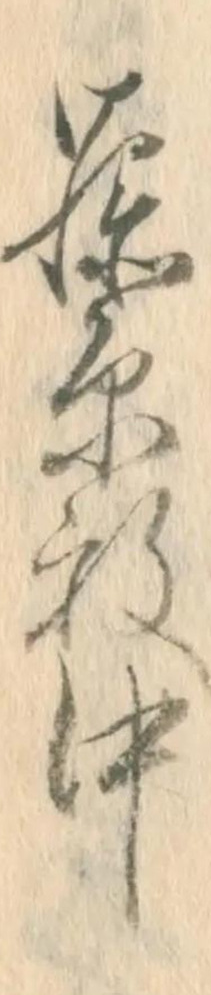藤原敦中
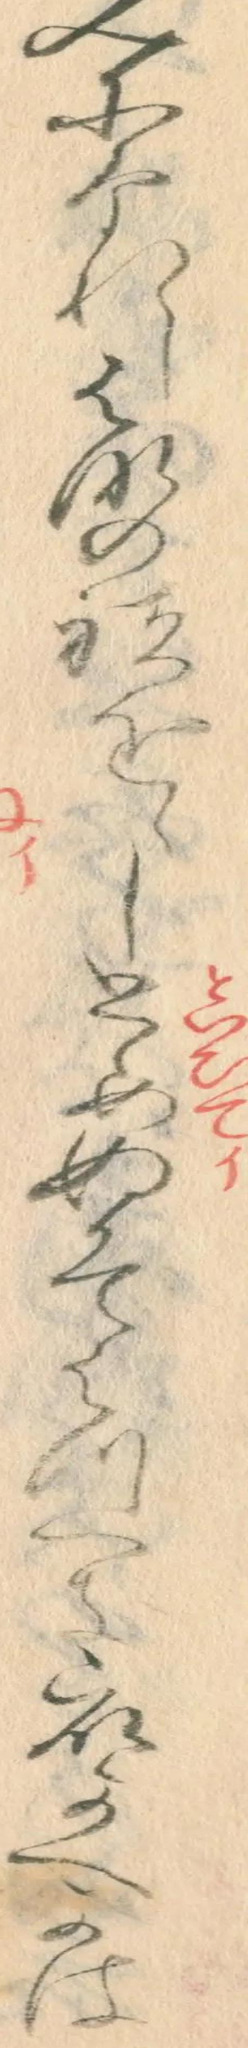みになれしはなの袂をゝしとゝめぬかてはつへき衣かへかは
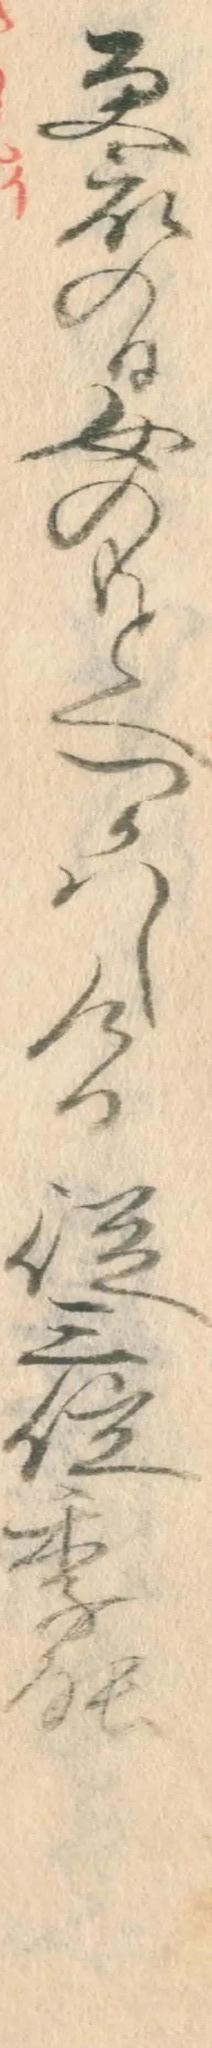更衣の日女のもとへつかはしける従三位季能
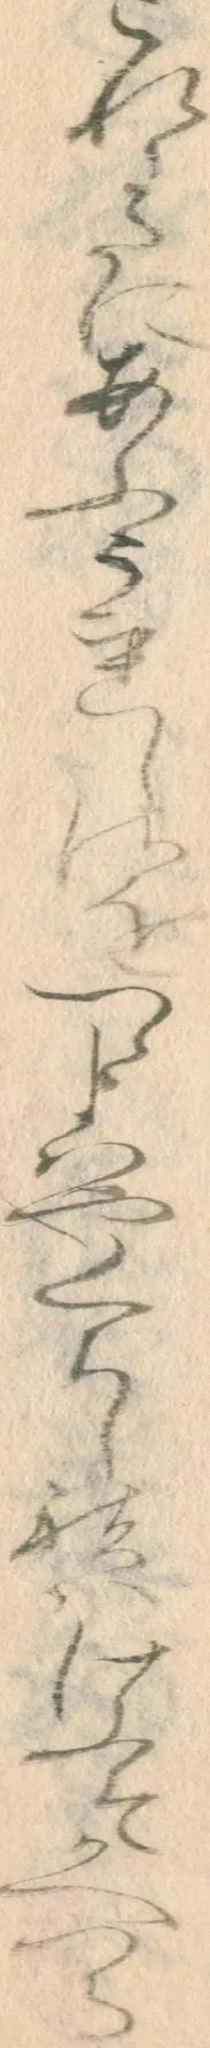これにたにあふうれしさをつゝまはやくちし袂はけふてかへつる
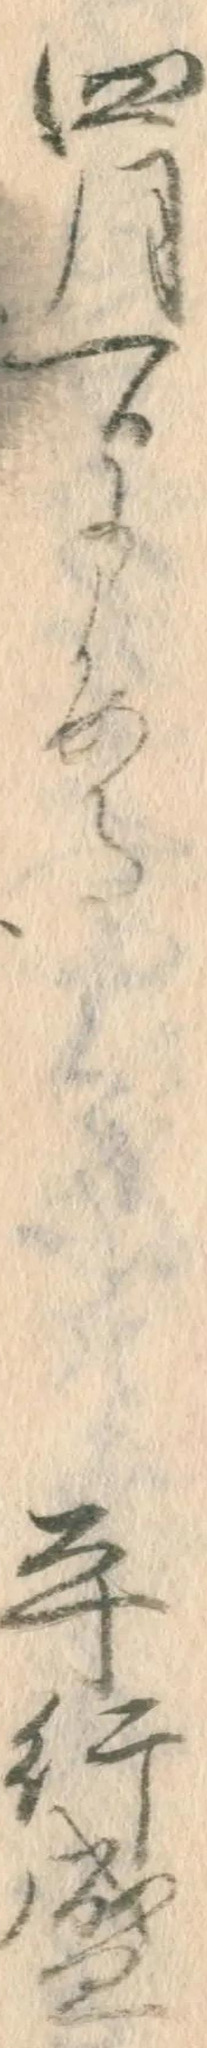四月一日によめる平行盛
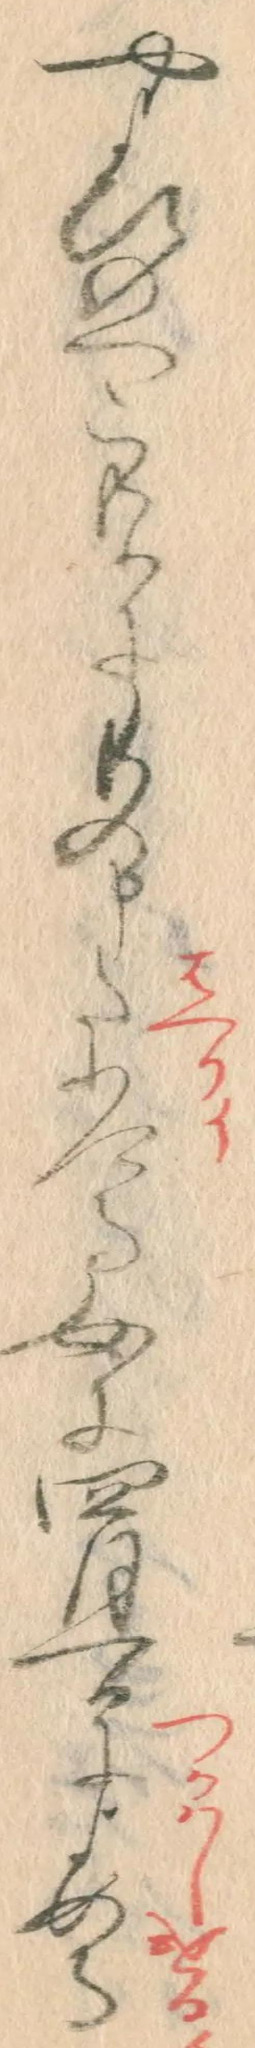やよひのつこもりにもの申たりける女に四月一日によめる
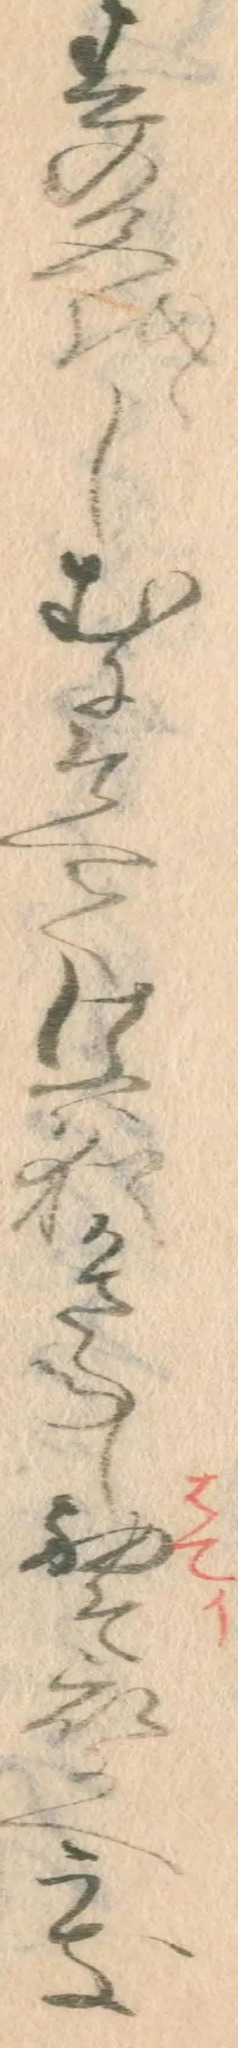春の色をゝしむにそへてけふは猶かさねし袖そ衣かへうき
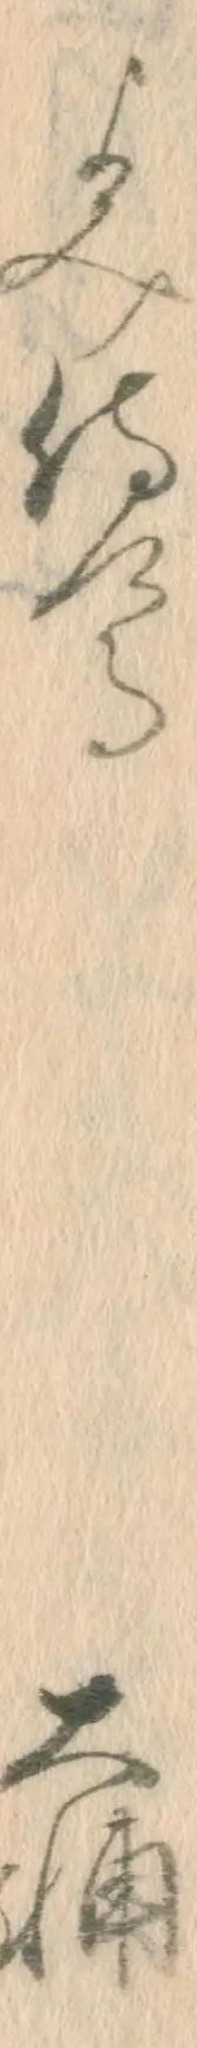よみ侍ける大輔
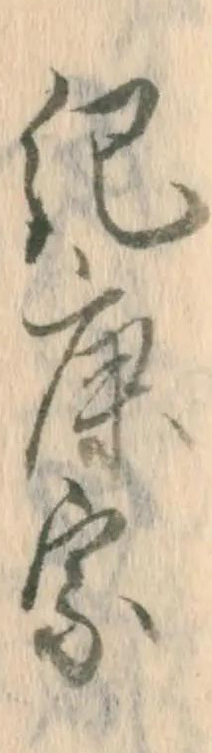紀康宗
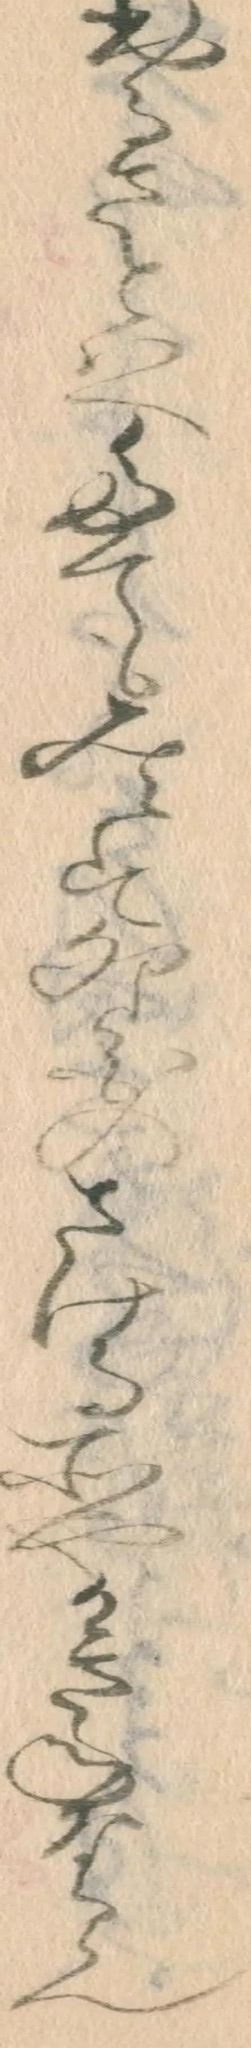ふるさとはへたてもみえす卯花のさける所やかきねなるらん
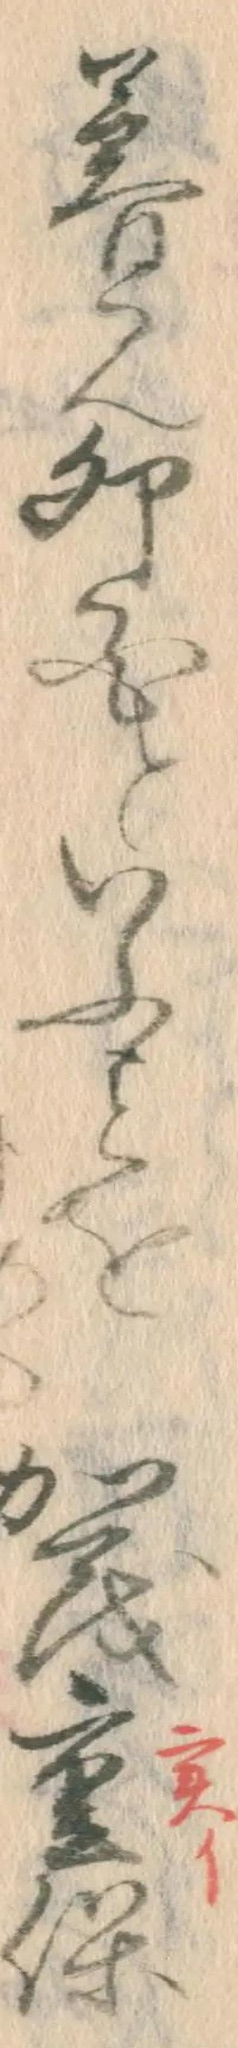暮見卯花といふことを加茂重保
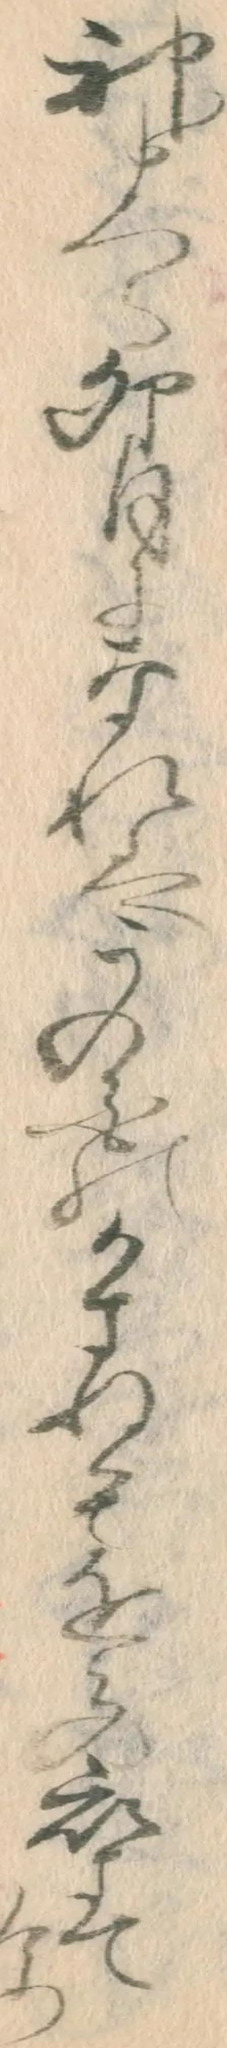神まつる卯月になれはうの花のかきねもをみの衣きてけり
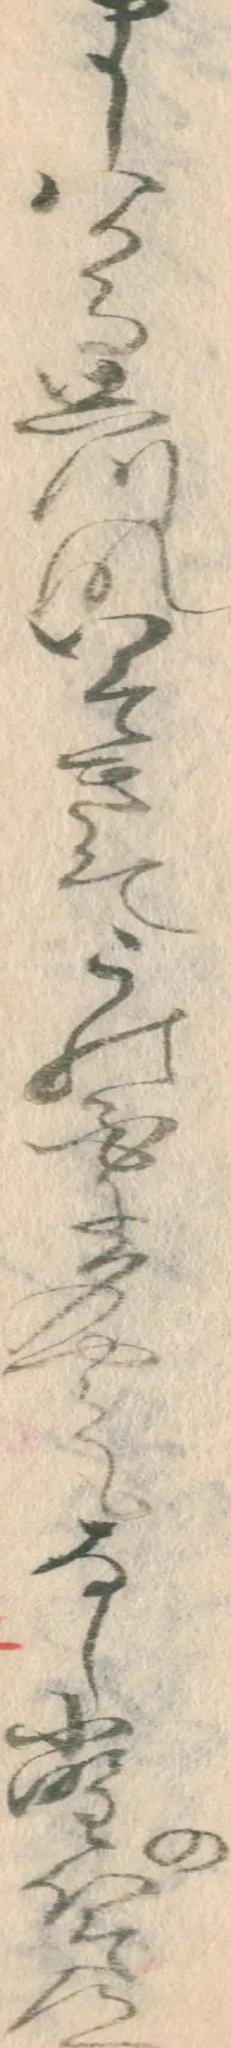ましはかるしつないてきそうの花に夕やみもなし小野のほそ道

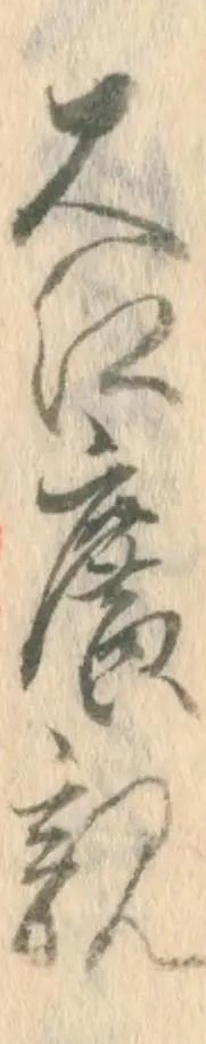大江広親
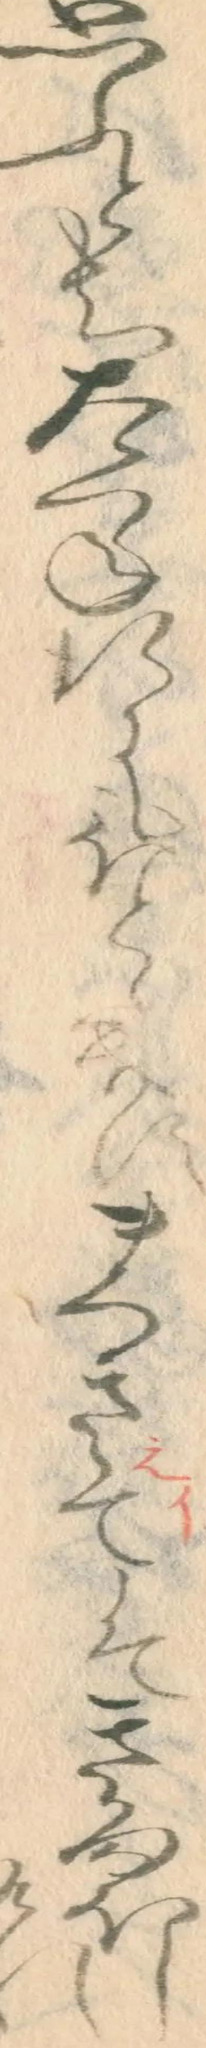思ふとちたつね行にもほとゝきすまつきえてこそかまほしけれ
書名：月詣和歌集
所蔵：国立国会図書館 National Diet Library, JAPAN
